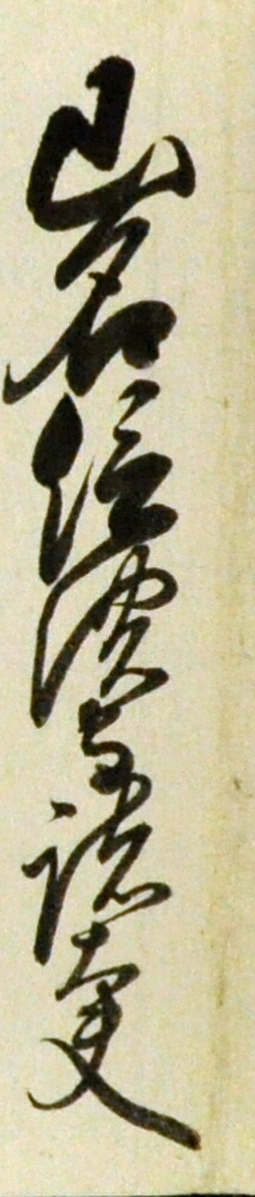山名信濃守諸大夫
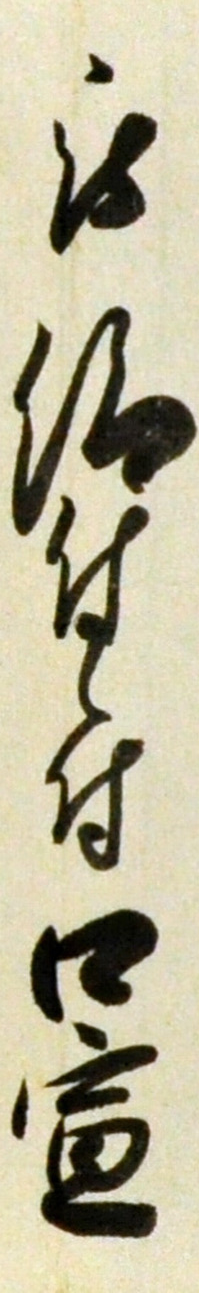被仰付候付口宣
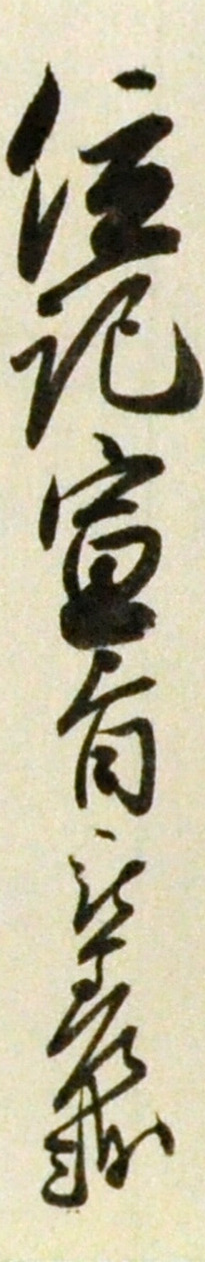位記宣旨被差越
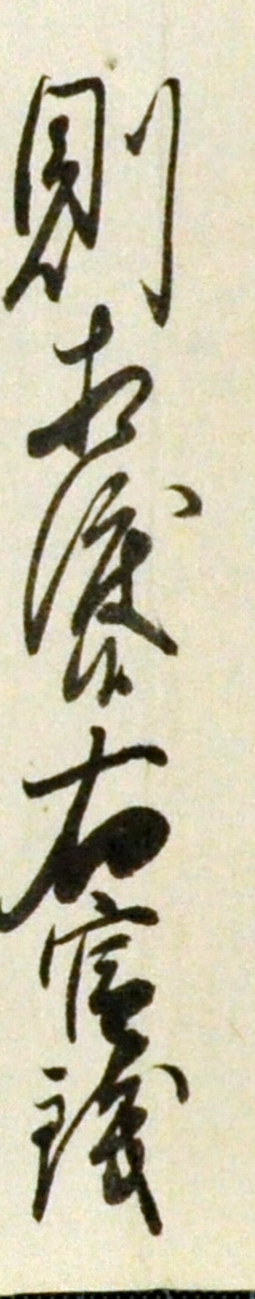則相渡候右官銭
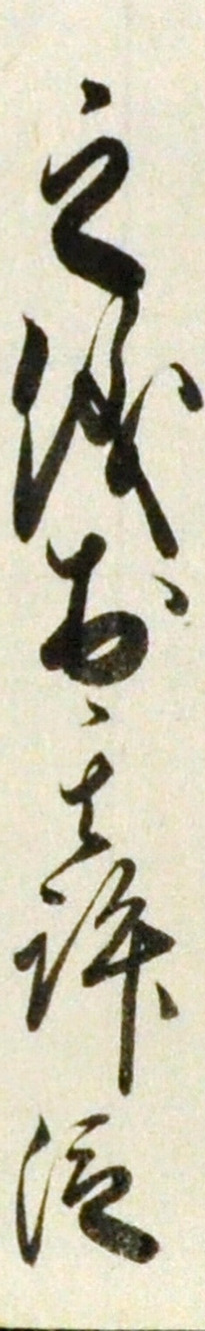之儀於其許従
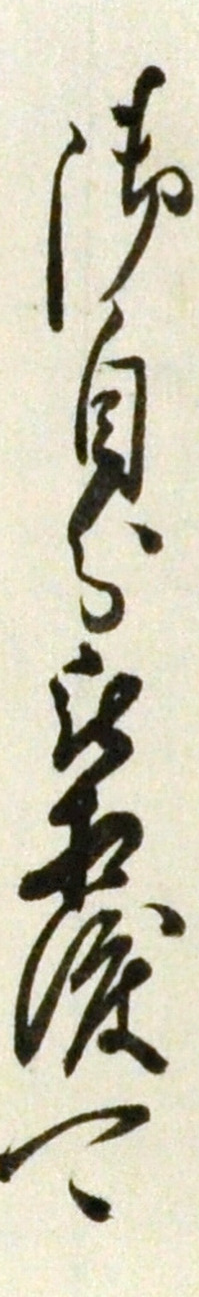御自分被相渡可
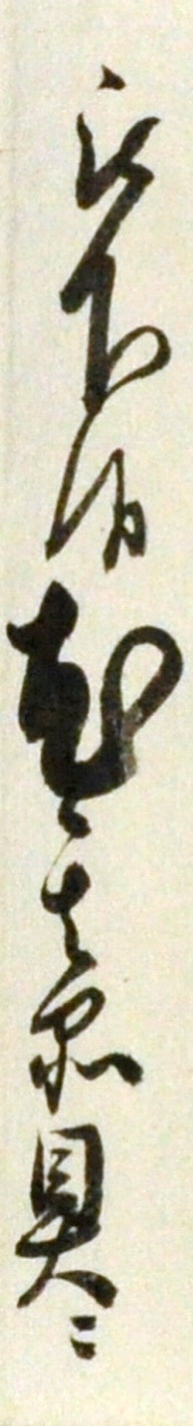被下候尤其品具に
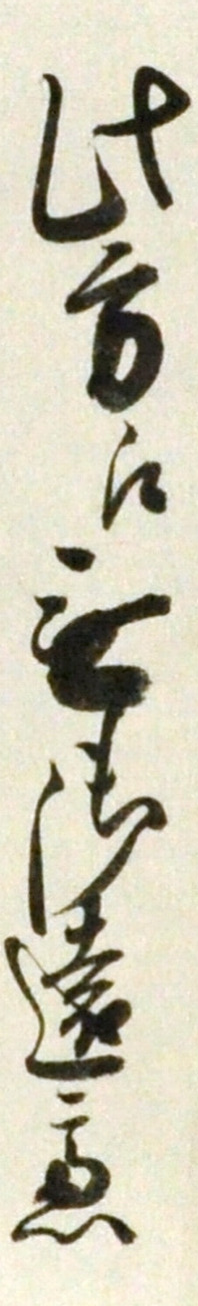此方え無御遠慮
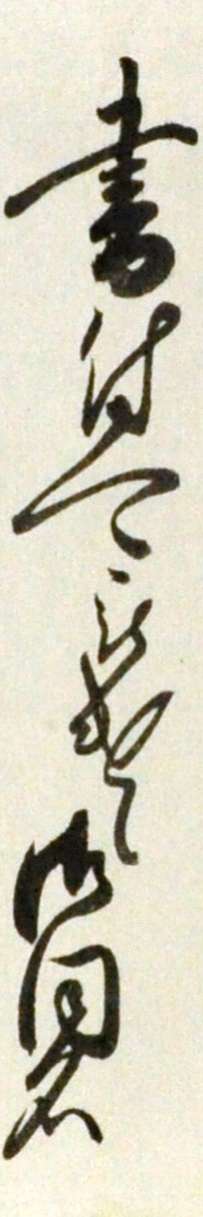書付可被遣候御同名
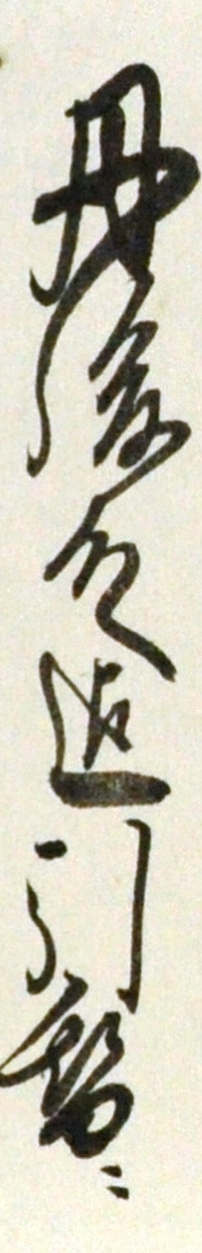丹後殿迄引替に
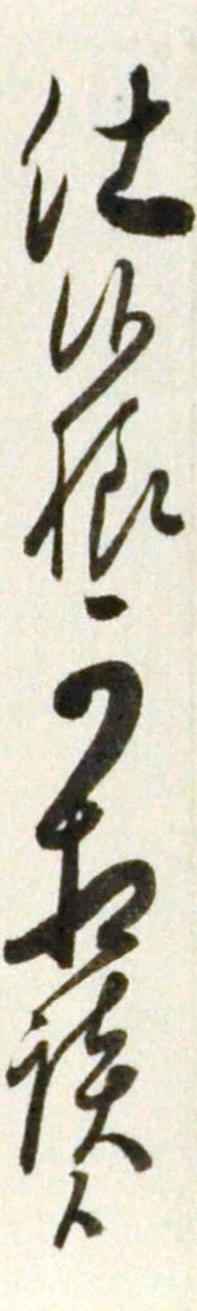仕候様可相談候
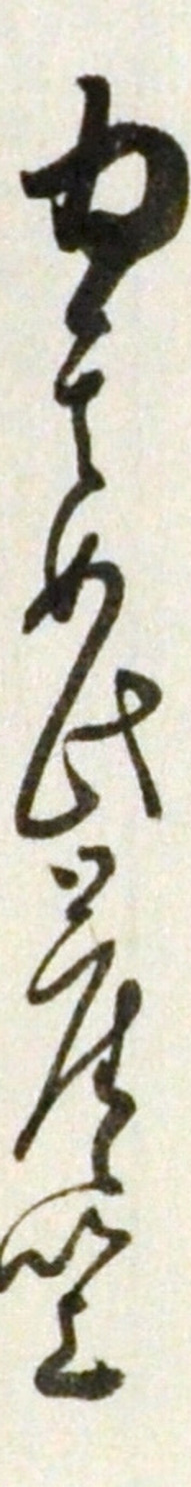為其如此御座候以上
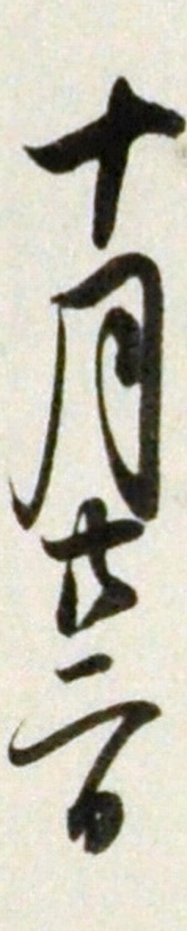十月廿二日
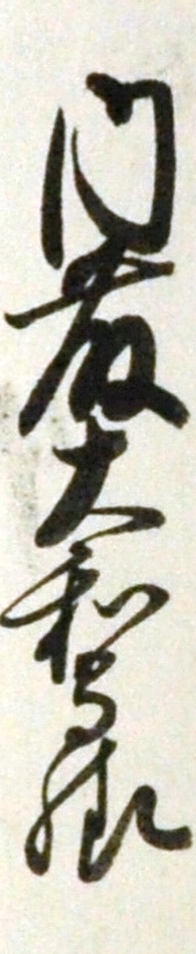内藤大和守様
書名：書状
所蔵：伊那市立高遠町図書館・合同会社AMANE
